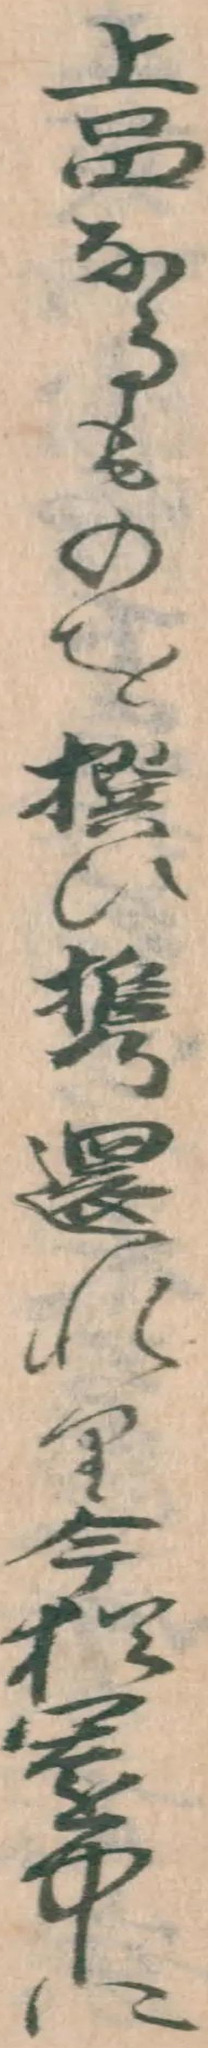上品なるものを撰ひ携還れり今猶睘中に
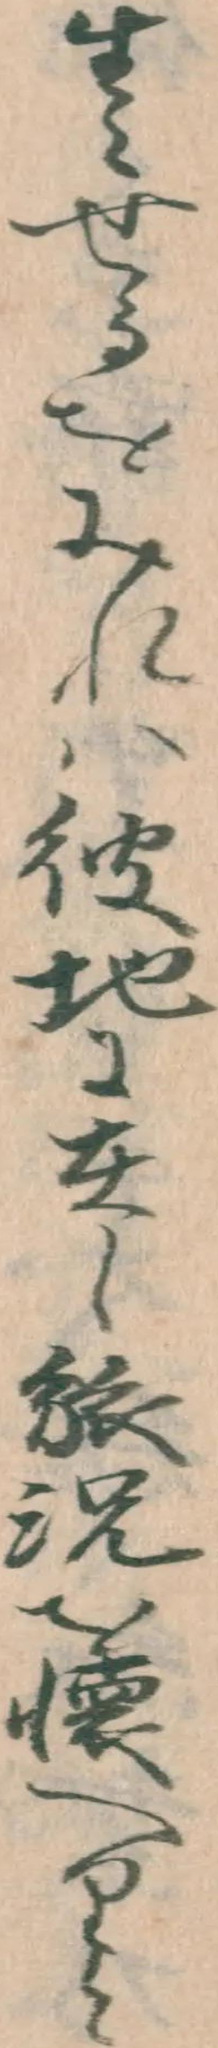生々せるをみれは彼地に在し旅況を懐へりと
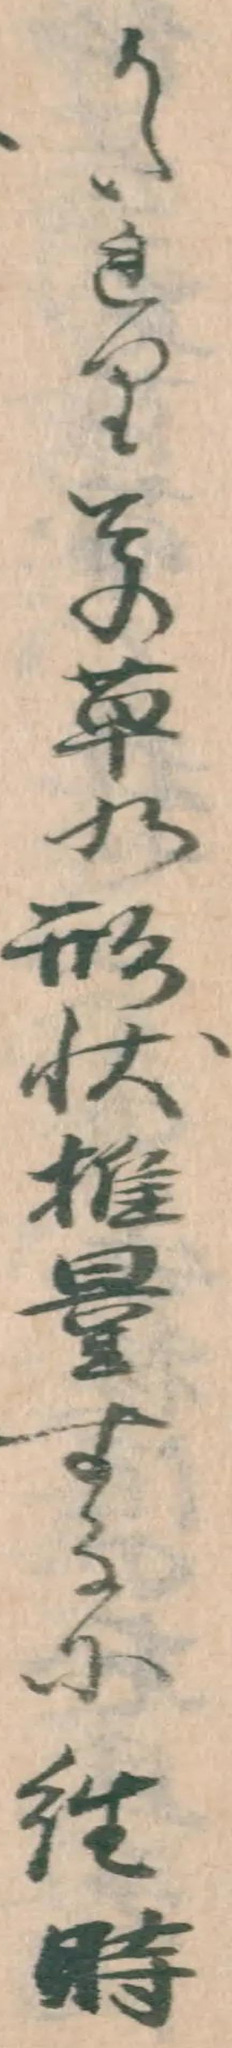かたれりその草の形状推量するに往時
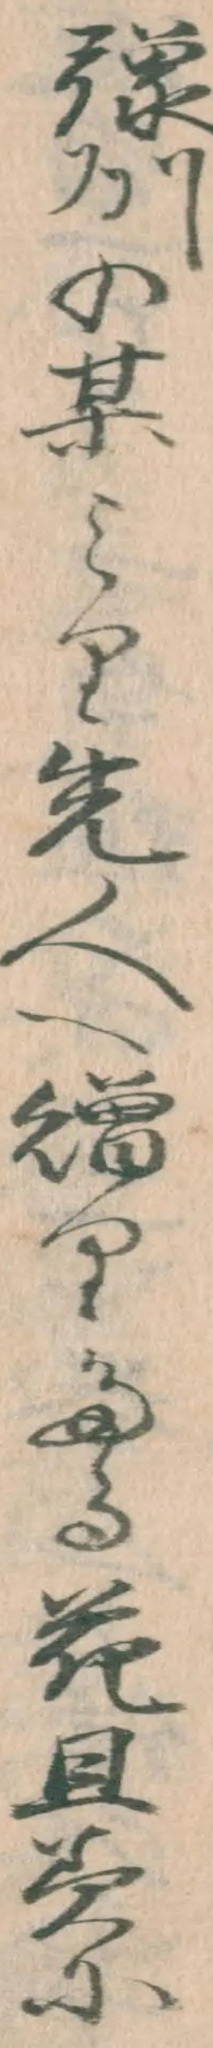豫洲の某より先人へ贈りたる花且美に
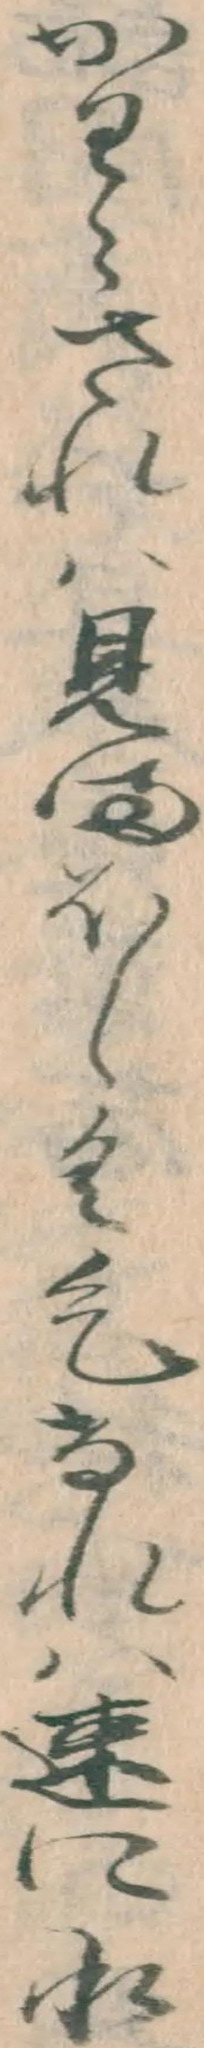かわらされは見まほしく乞たれは速に承
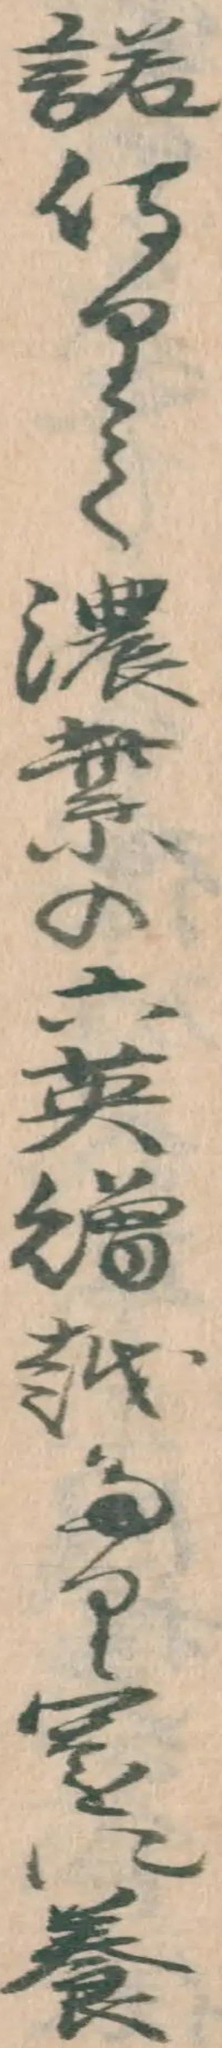諾侍りて濃紫の六英贈越たり睘に養

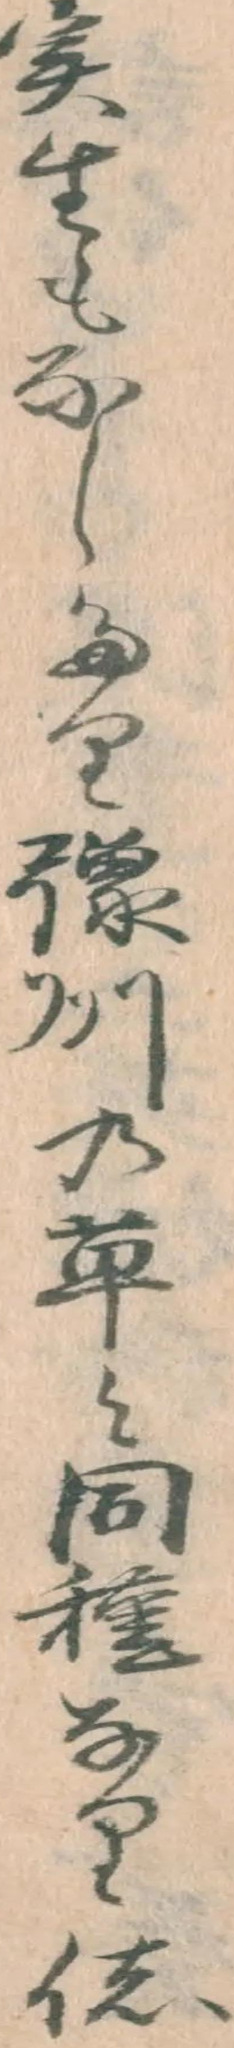実生もなしたり豫洲の草の同種なり依
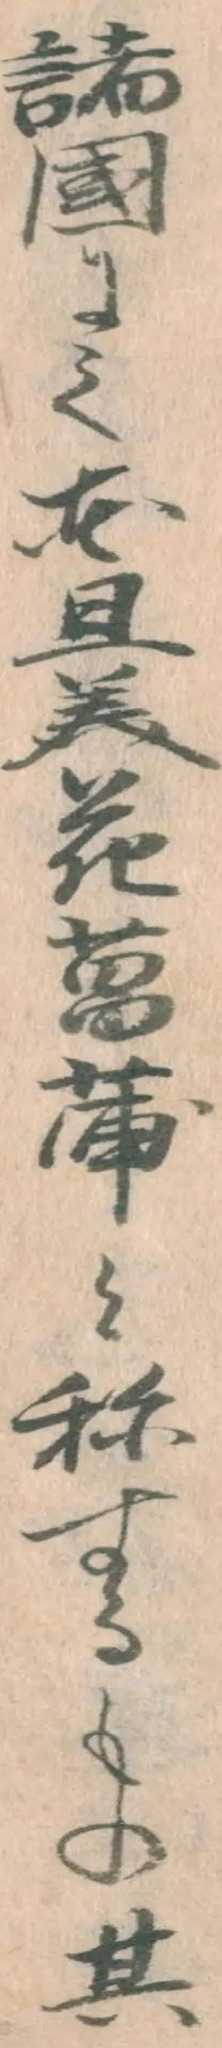諸国にて花且美花菖蒲と称するもの其
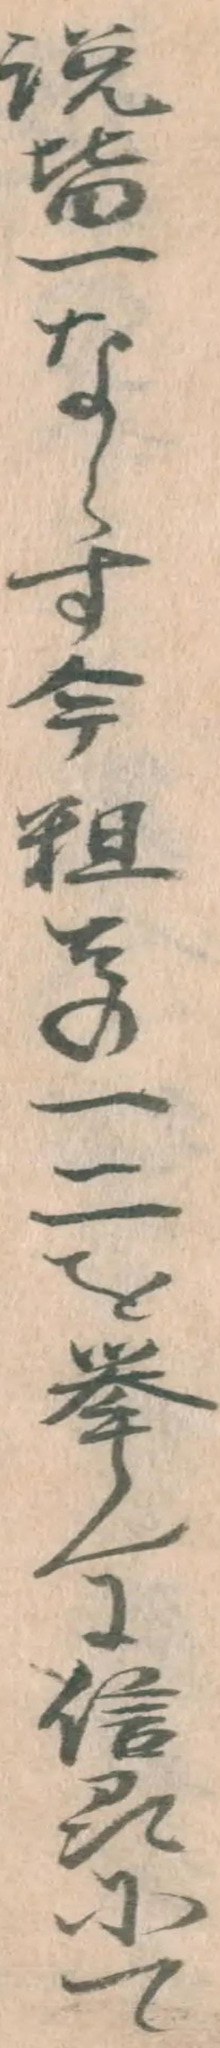説皆一ならす今粗その一二を挙んに信州にて
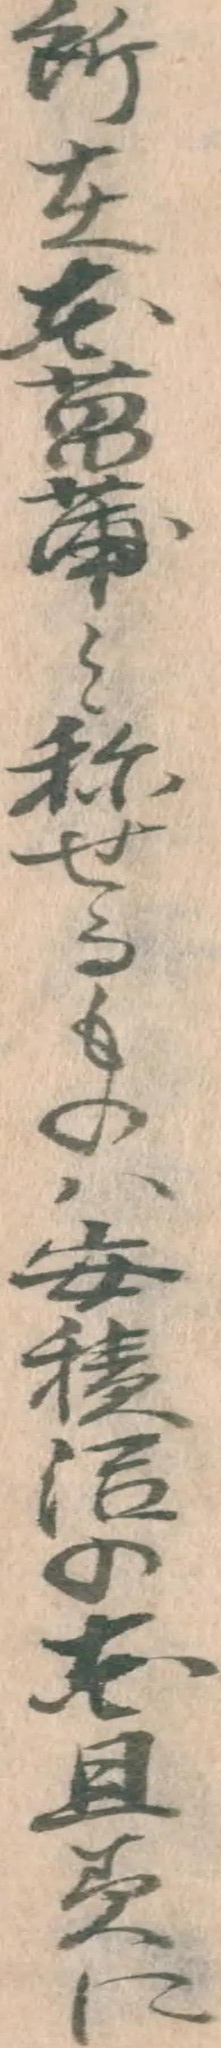所在花菖蒲と称せるものは安積沼の花且美に
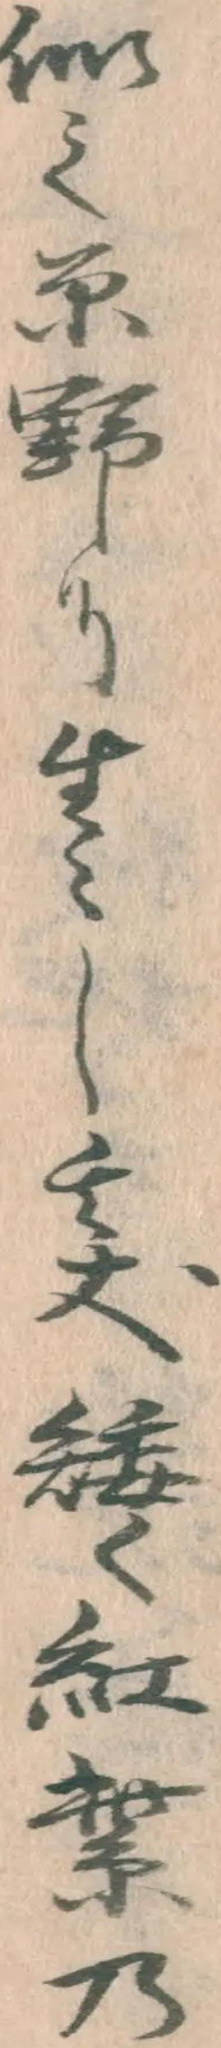似て原野に生々し其丈矮く紅紫の
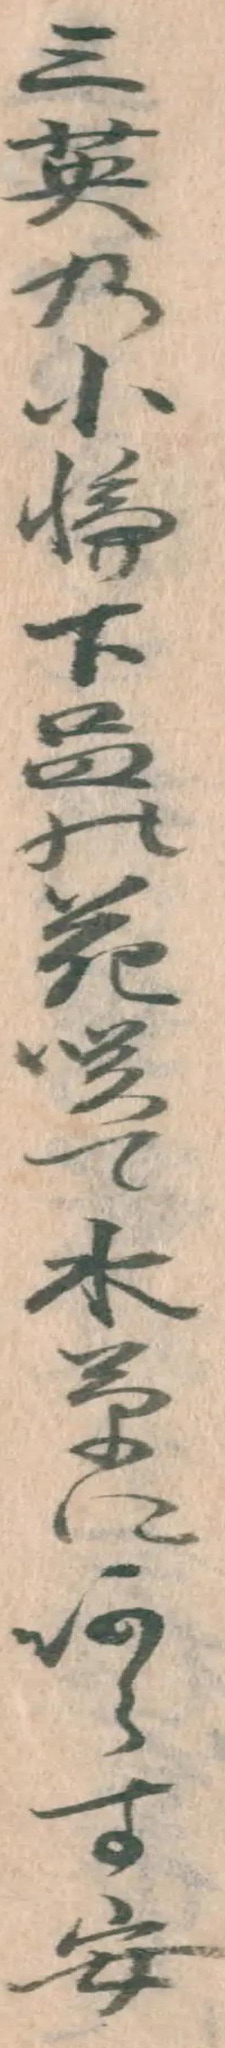三英の小輪下品の花咲て水草にあらす安
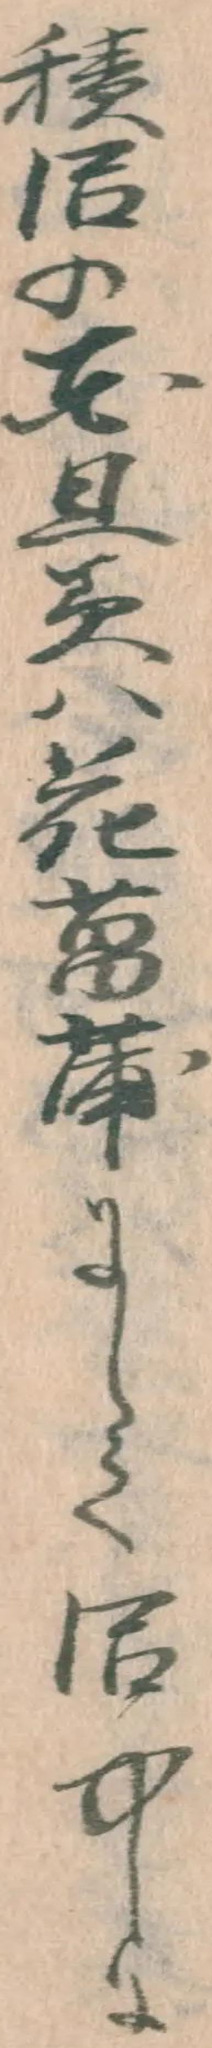積沼の花且美は花菖蒲にして沼中に
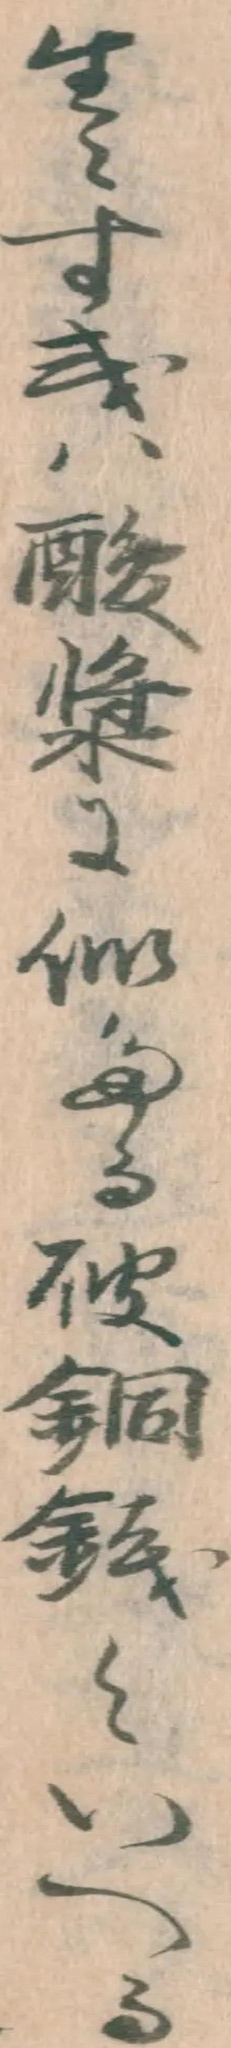生々す或は酸漿に似たる破銅銭といへる
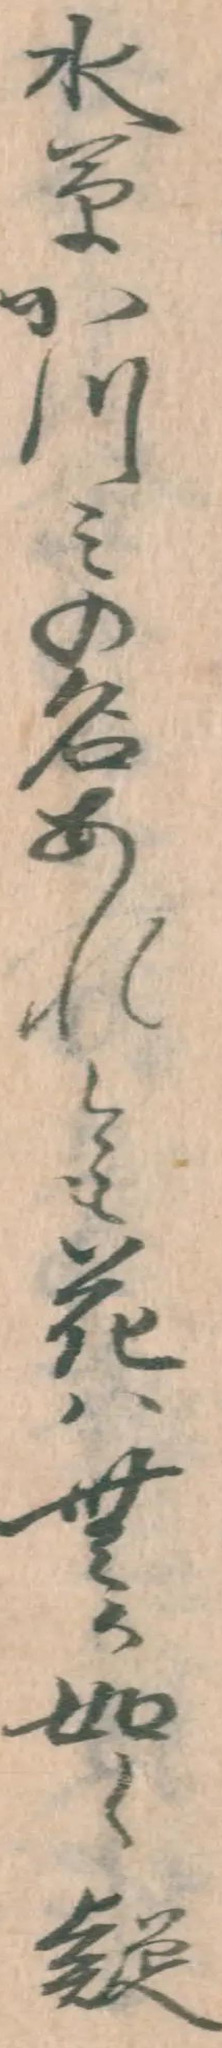水草かつみの名あれとも花は無か如く疑
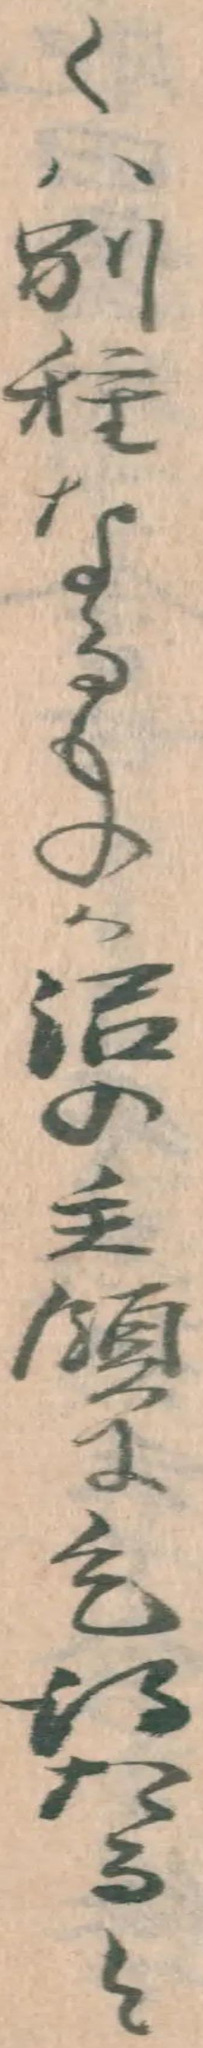くは別程なるものか沼の主領に乞得たると
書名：花菖培養録
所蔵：国立国会図書館 National Diet Library, JAPAN
